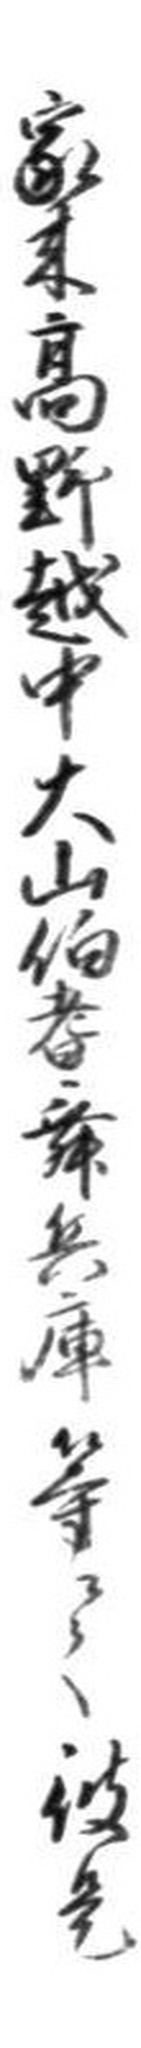家来高野越中大山伯耆舞兵庫等にて彼是
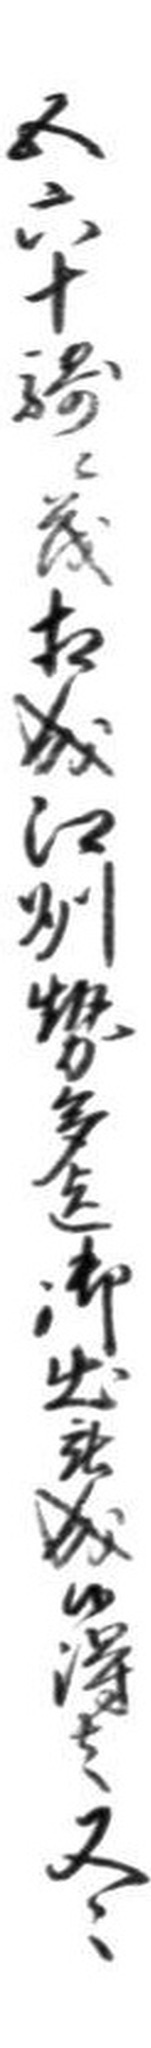五六十騎ニも相成江州勢多迄御出被成候得者又々
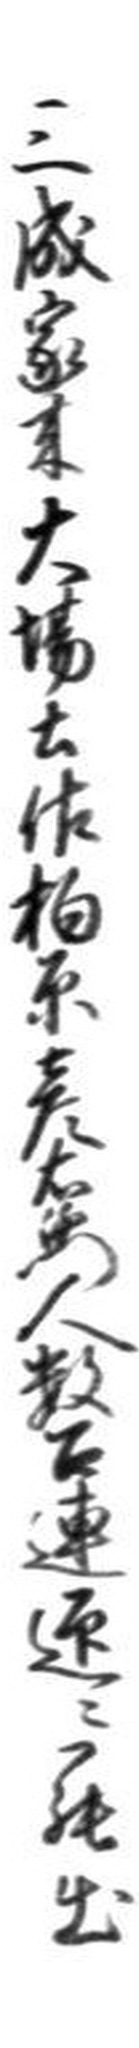三成家来大場土佐柏原彦右衛門人数召連迎ニ罷出
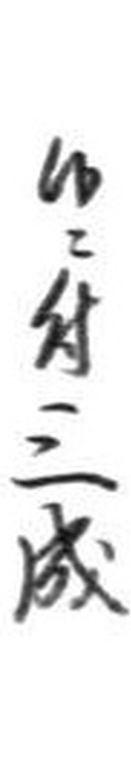候ニ付三成
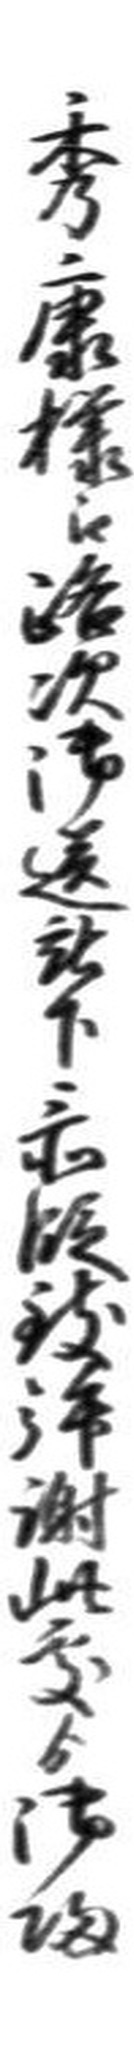秀康様江路次御送被下忝段致拝謝此処ゟ御帰
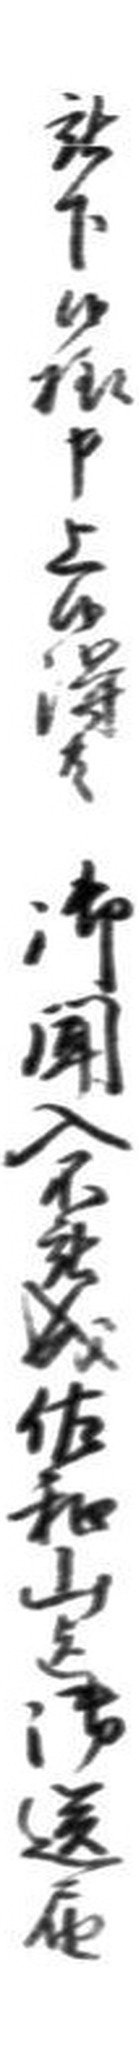被下候様申上候得共御聞入不被成佐和山迄御送届
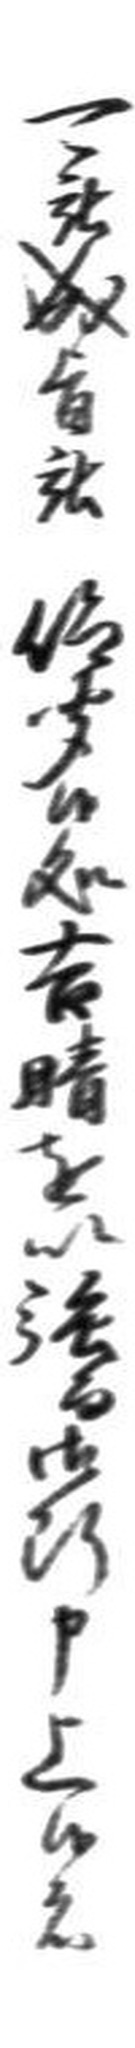可被成旨被仰聞候処吉晴を以強而御断申上候者
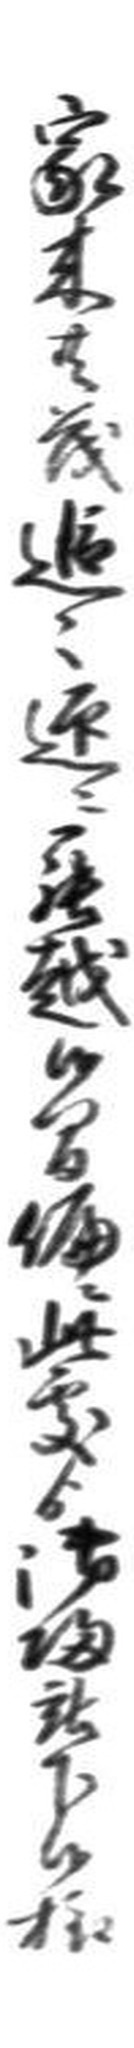家来共も追々迎ニ罷越候間偏ニ此処ゟ御帰被下候様
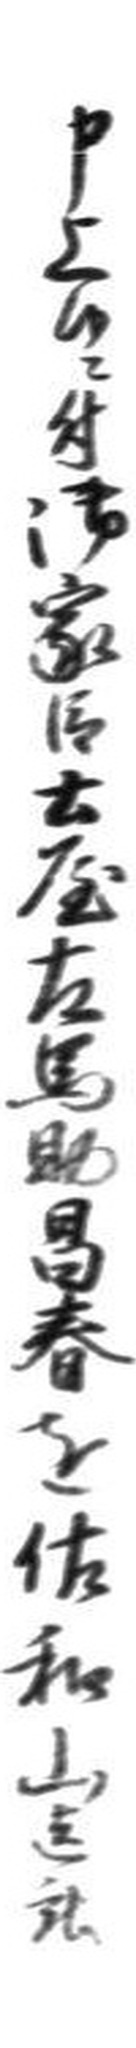申上候ニ付御家臣土屋左馬助昌春を佐和山迄被
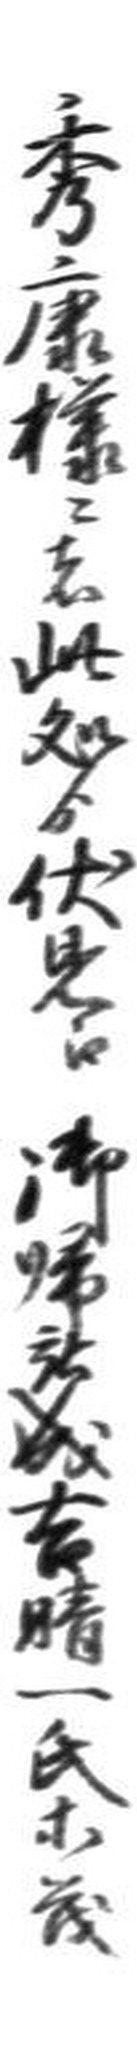秀康様ニ者此処ゟ伏見江御帰被成吉晴一氏等も
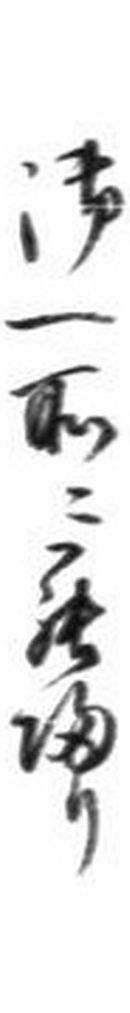御一所ニ罷帰り

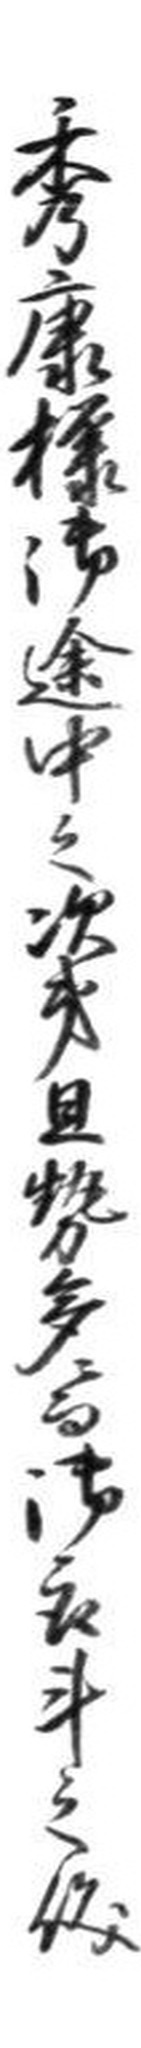秀康様御途中之次第且勢多ニ而御取斗之儀
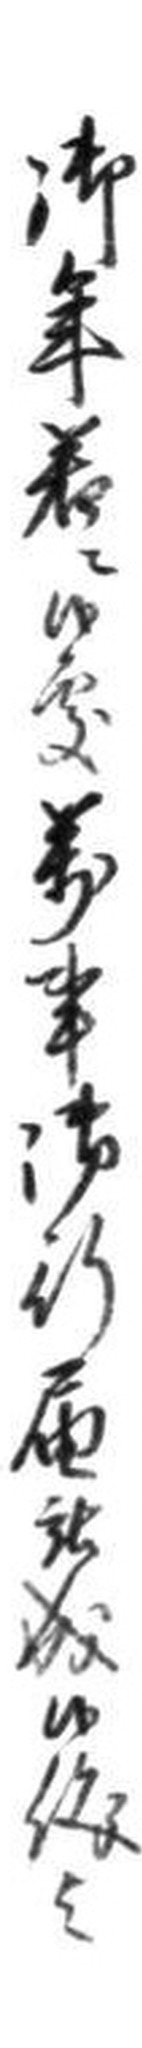御年若ニ候処万事御行届被成候儀と
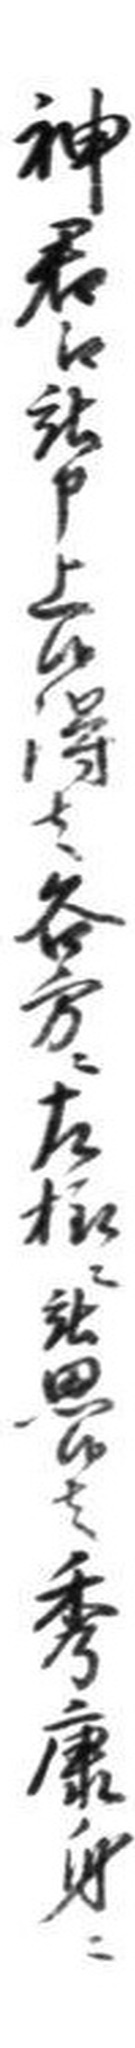神君江被申上候得者各方ニ左様ニ被思候者秀康身ニ
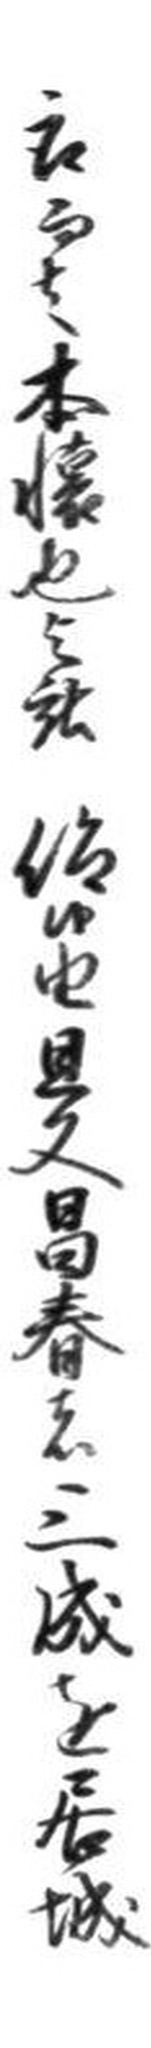取而者本懐也と被仰候由且又昌春者三成を居城
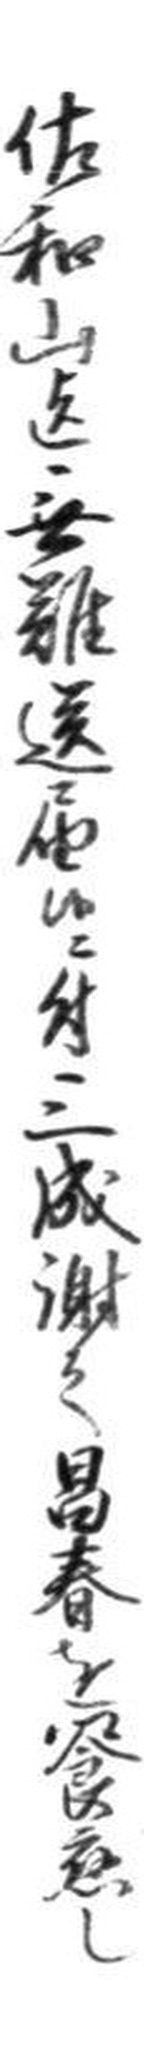佐和山迄無難送届候ニ付三成謝之昌春を饗応し
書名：家譜 一 秀康公 従天正二年到慶長十二年
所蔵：福井県文書館 Fukui Prefectural Archives
